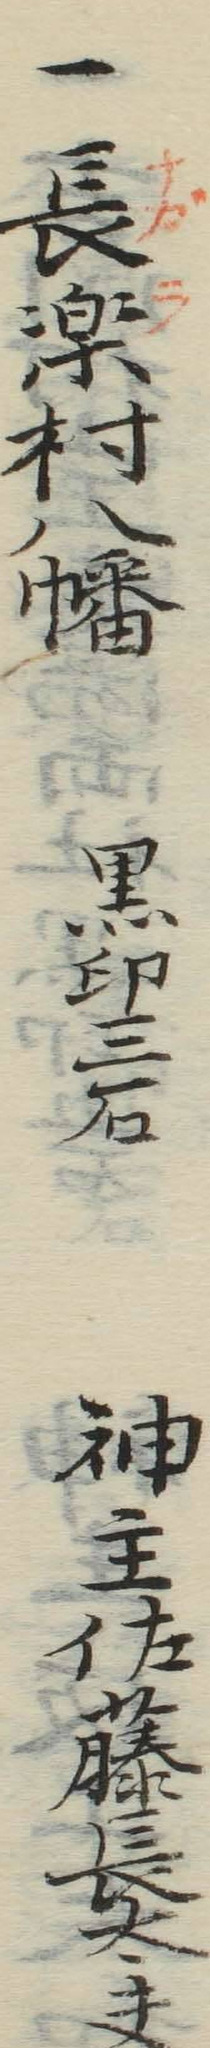一長楽村八幡黒印三石神主佐藤長太夫
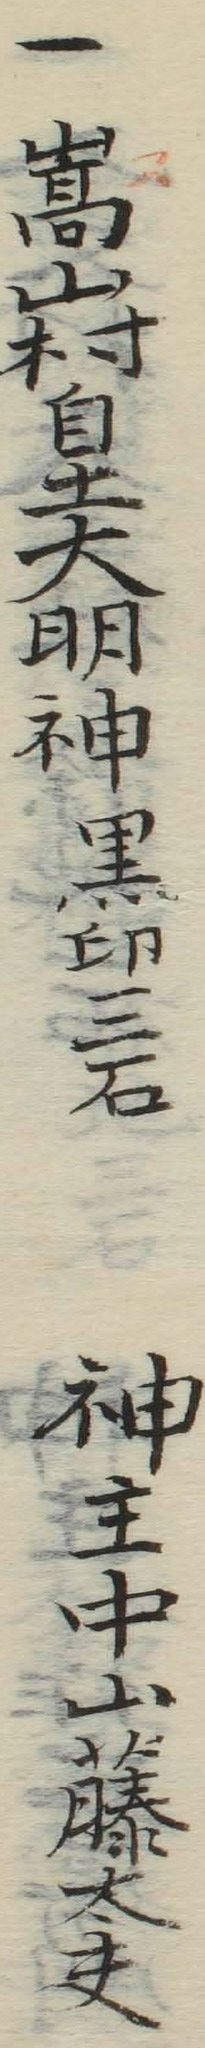一嵩山村皇大明神黒印三石神主中山藤太夫
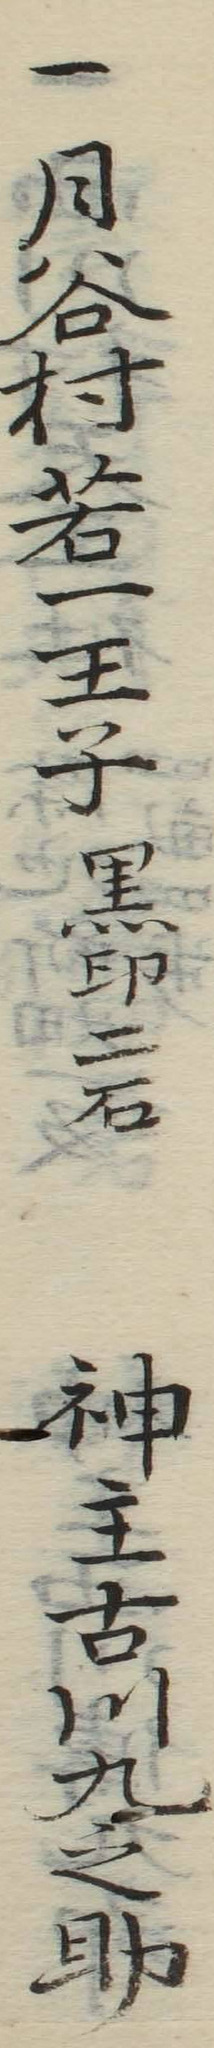一月谷村若一王子黒印二石神主古川九之助
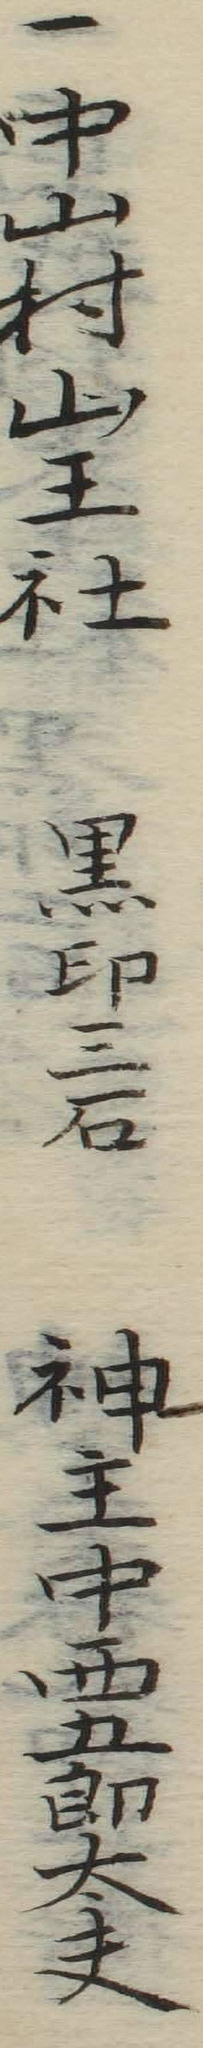一中山村山王社黒印三石神主中西五郎太夫

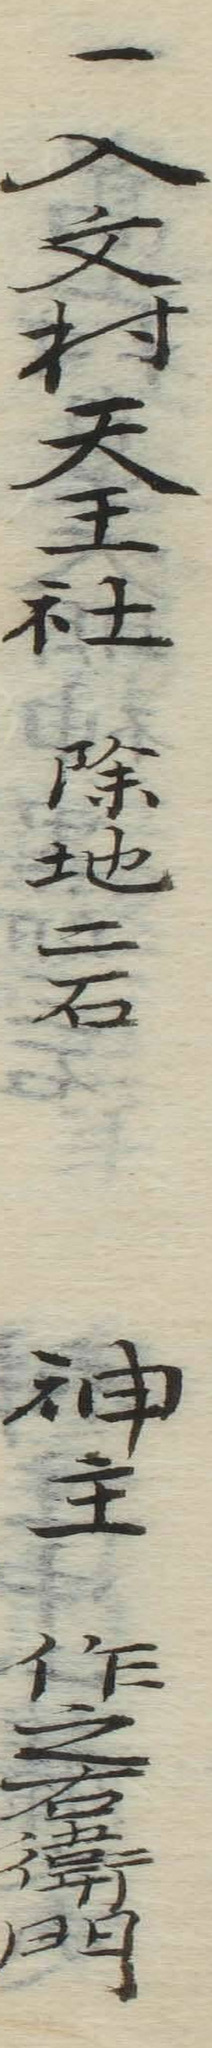一入文村天王社除地二石神主作之右衛門
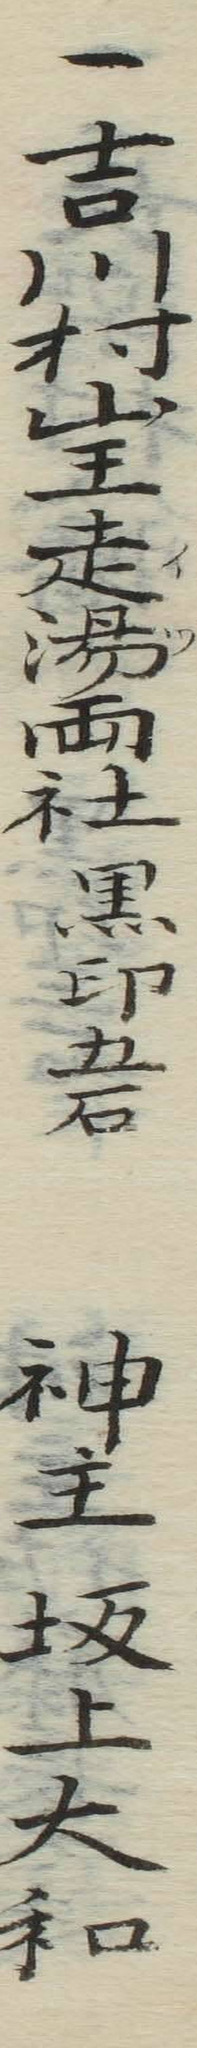一吉川村山王走湯両社黒印五石神主坂上大和
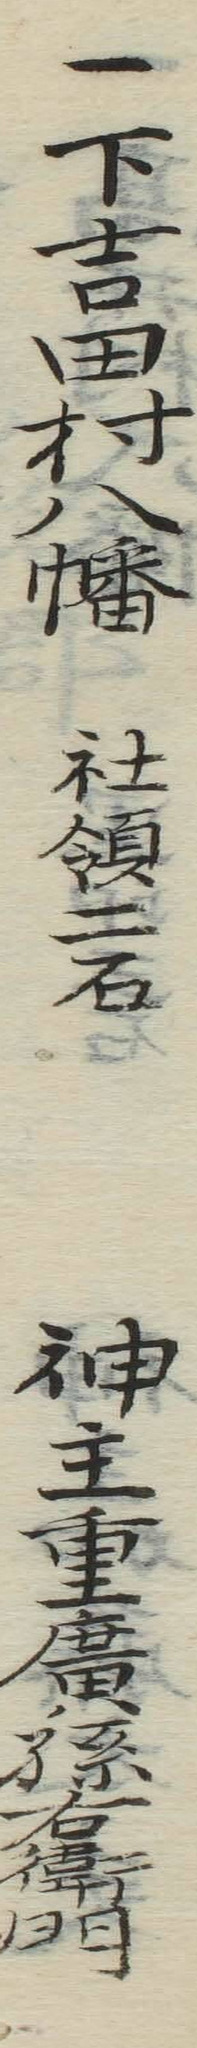一下吉田村八幡社領二石神主重広孫右衛門
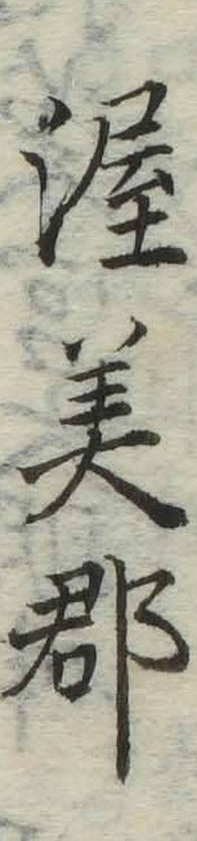渥美郡
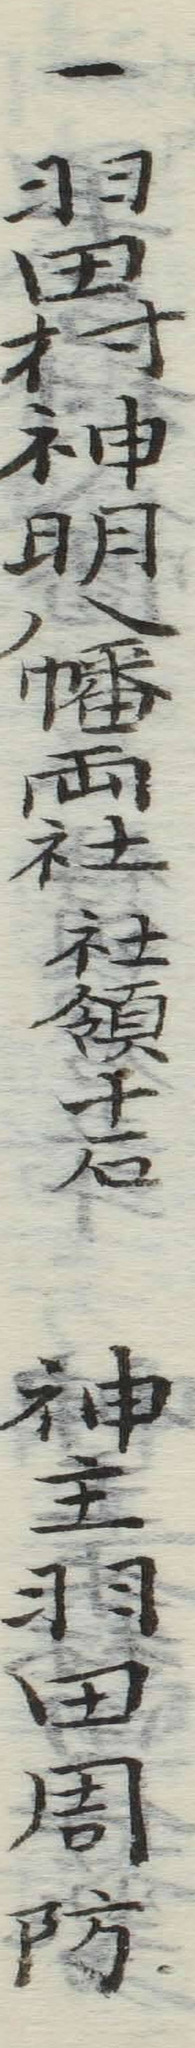一羽田村神明八幡両社社領十石神主羽田周防
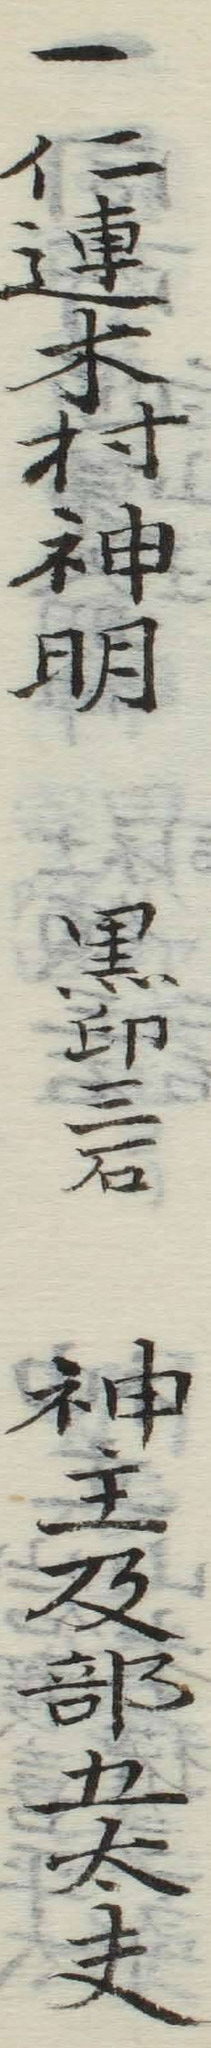一仁連木村神明黒印三石神主及部五太夫
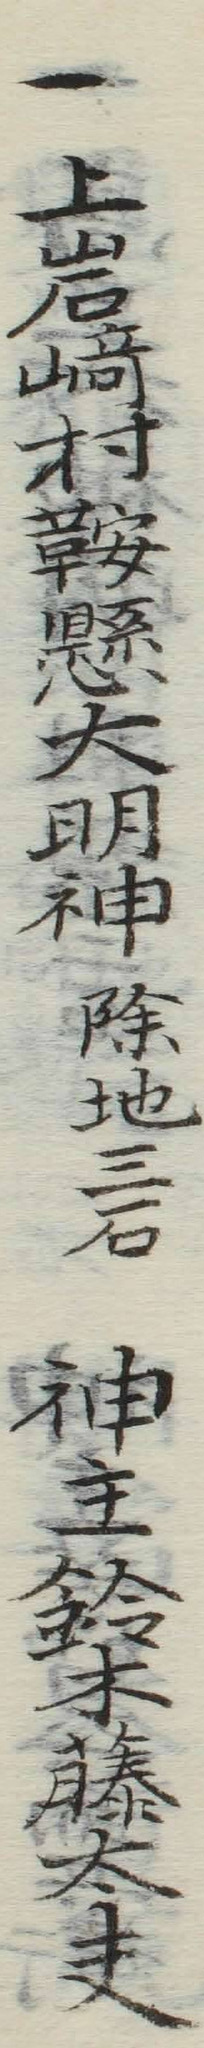一上岩崎村鞍懸大明神除地三石神主鈴木藤太夫

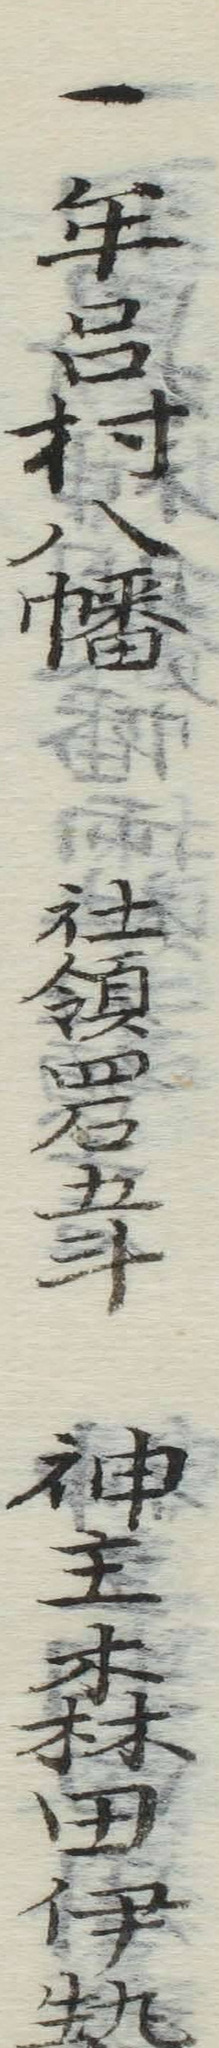一牟呂村八幡社領四石五斗神主森田伊勢

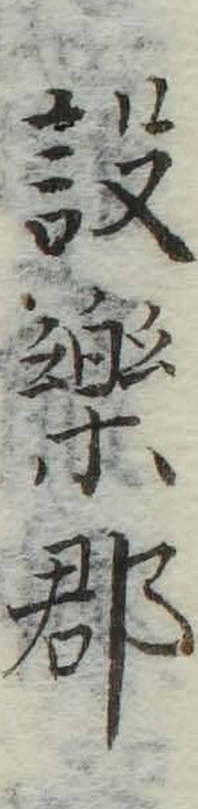設楽郡
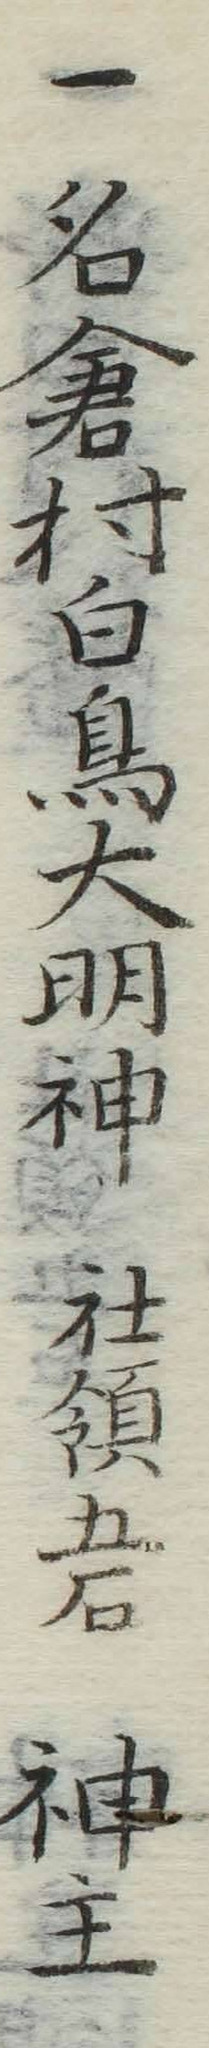一名倉村白鳥大明神社領五石神主
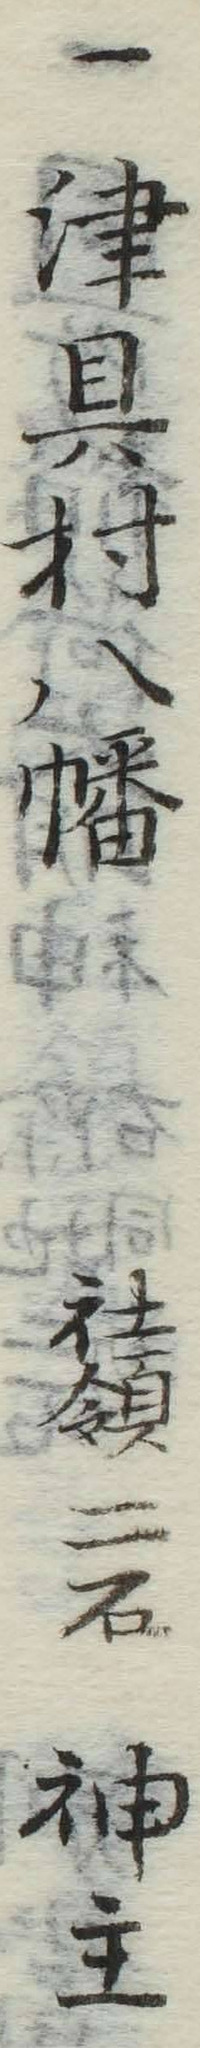一津具村八幡社領二石神主
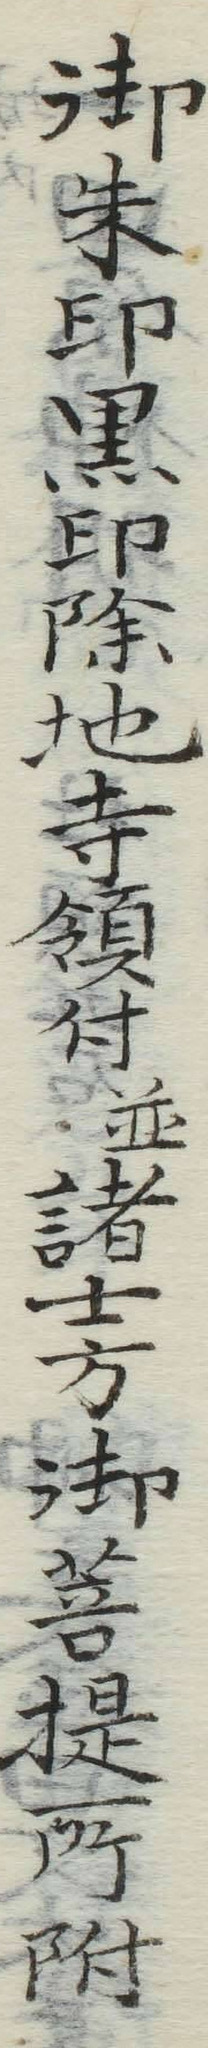御朱印黒印除地寺領付並諸士方御菩提所付
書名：三河国二葉松
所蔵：国文学研究資料館
